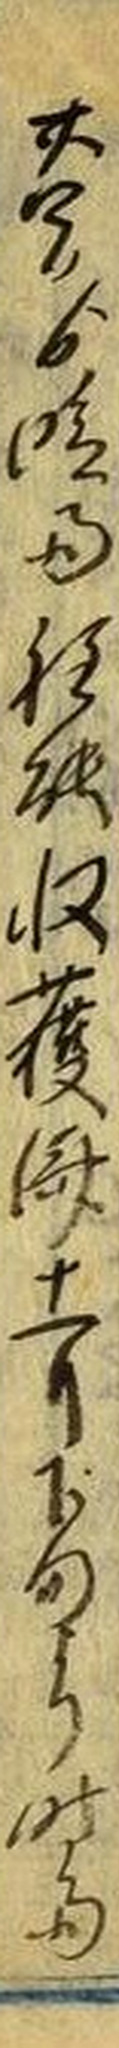廿四日ゟ段暖雨程能収穫済十一月下旬ゟ時雨
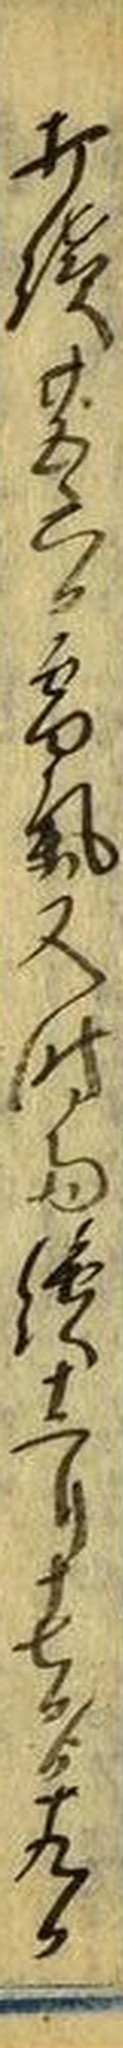打続廿五六日雪風又時雨続十二月十七日ゟ十九日
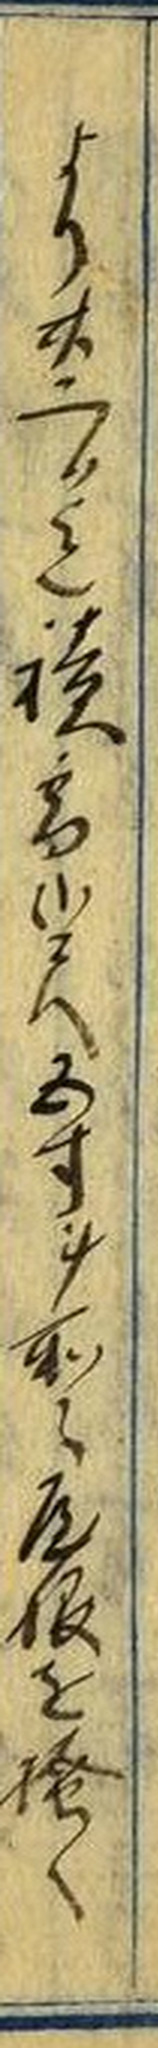より廿二日迄積雪弐尺五寸計所々屋根を掻く
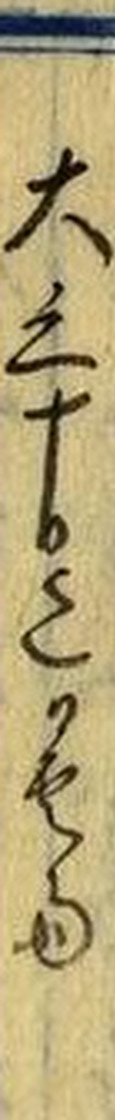大三十日迄曇雨
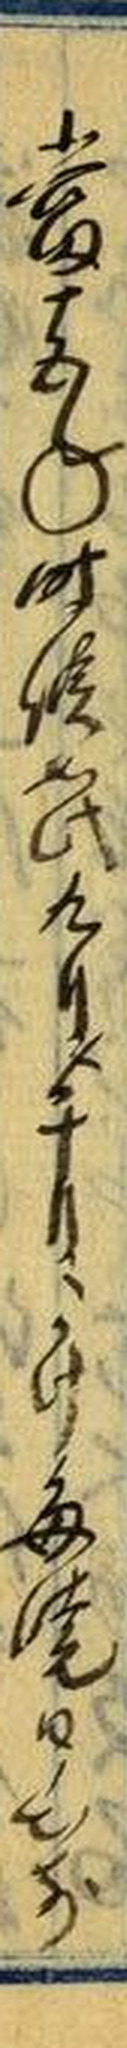当十五年時候如此九月ゟ十月へかけ毎暁日の出前
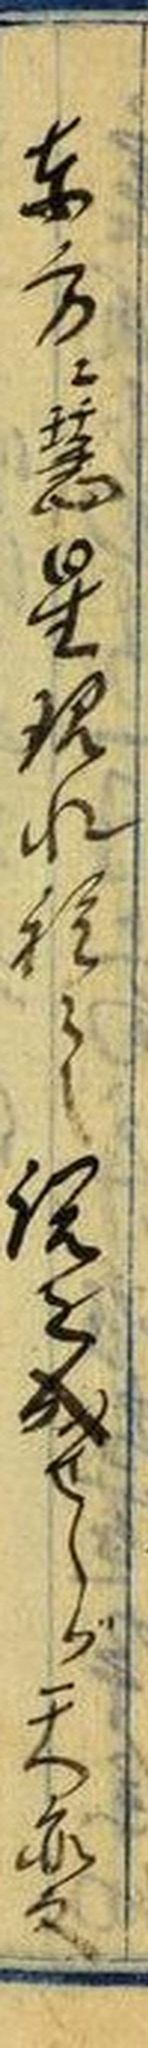東方に彗星現れ種々之説を成せしが天変
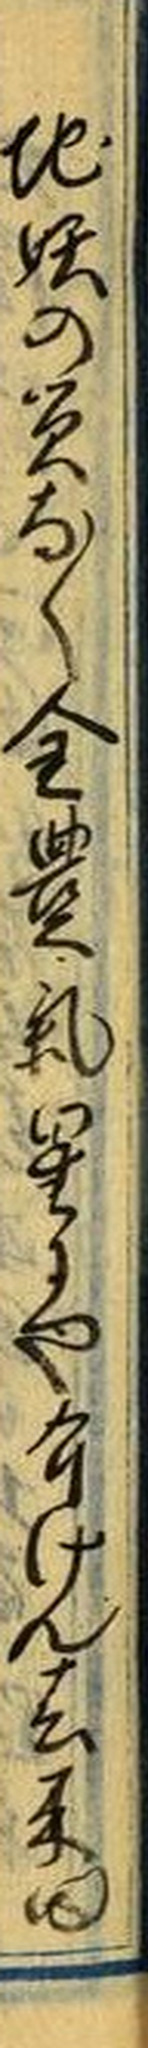地妖の災なく全豊気星にや有けん春来田
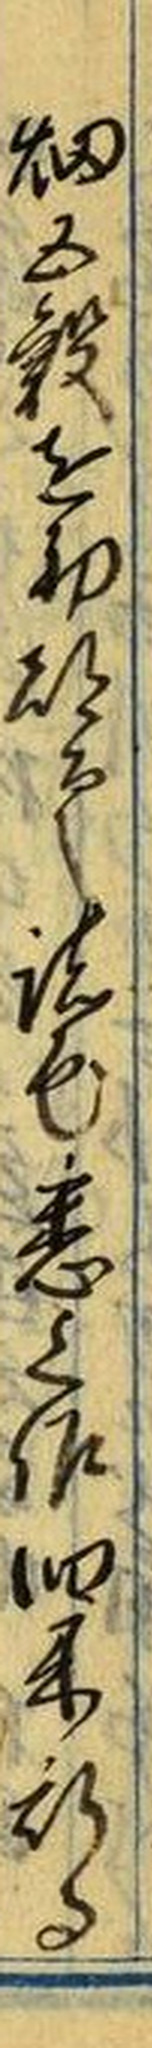畑五穀を初都而之諸色悉上作旧来斯る
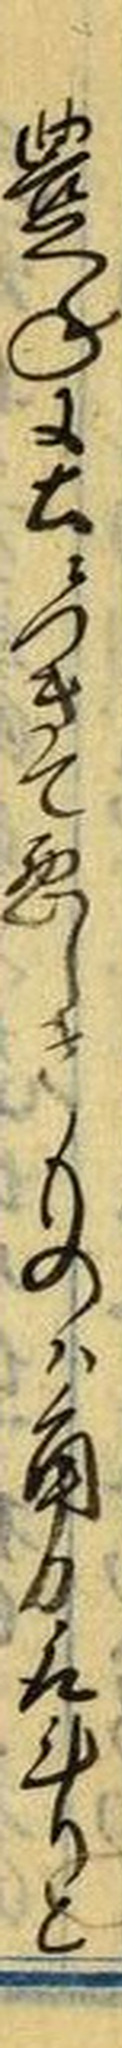豊年に土につきて悪しきものは角力取計りと
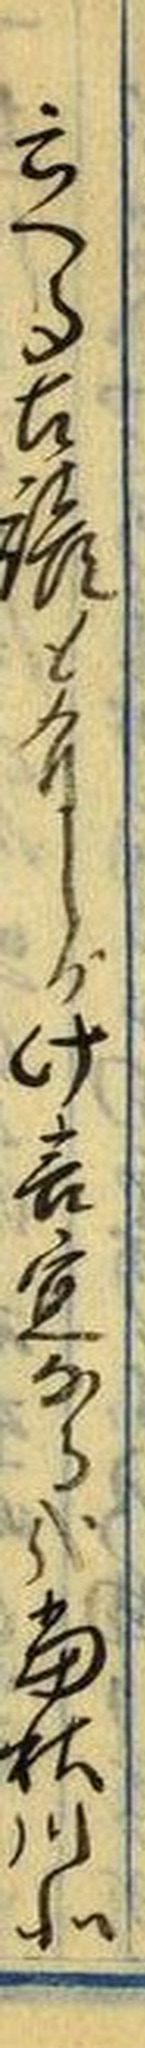云へる古諺も有しが此言宜なる哉当秋川北
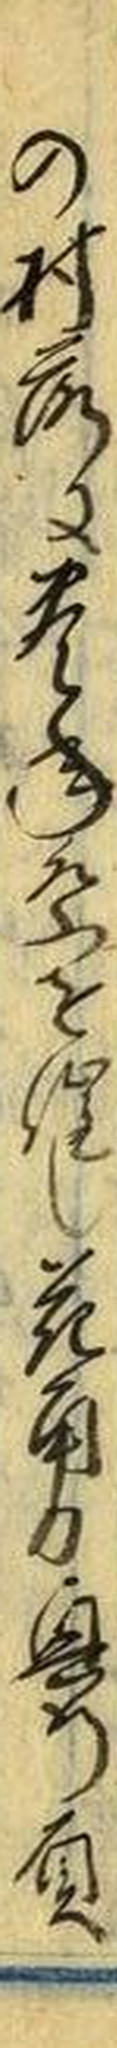の村落に豊年祭を催し花角力興行負
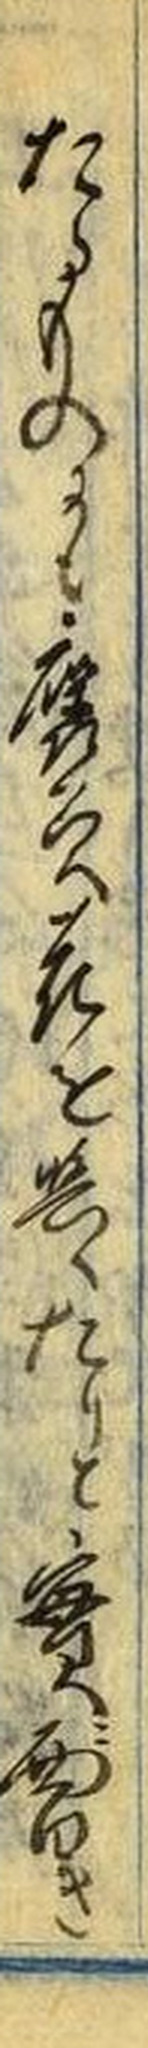たるものにも褒美花を与へたりと実に面白き
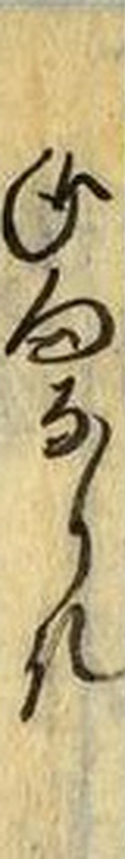趣向なりき

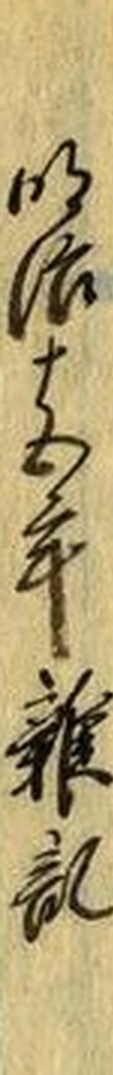明治十五年雑記
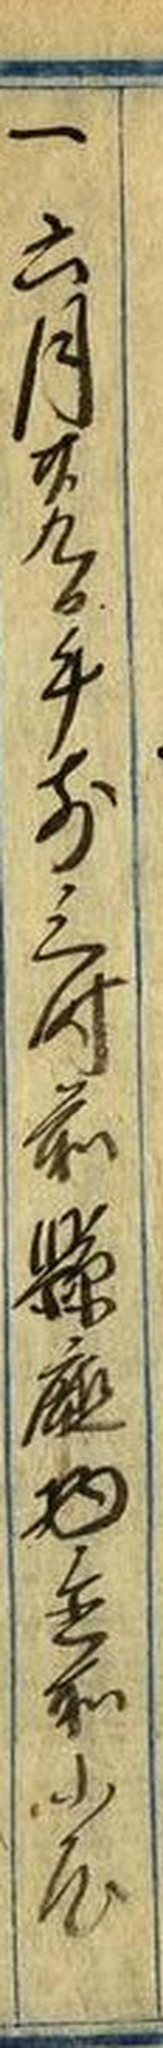一六月廿九日御前三時前県庁物置所小屋
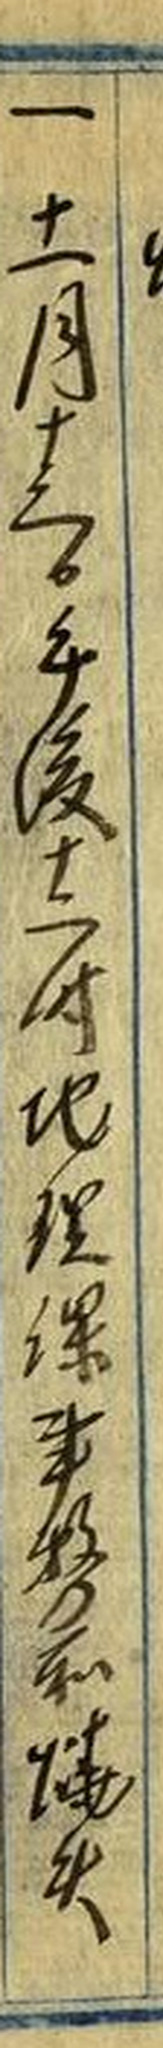一十一月十三日午後十二時地理課事務所焼失
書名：温古集 五巻
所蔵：福井県文書館 Fukui Prefectural Archives
